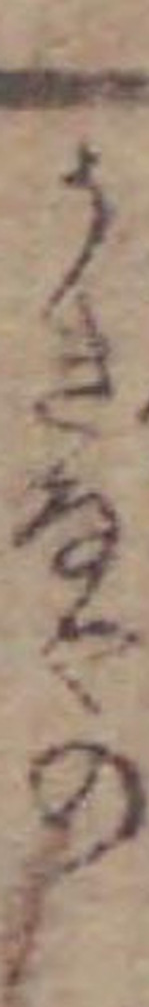うきなやの
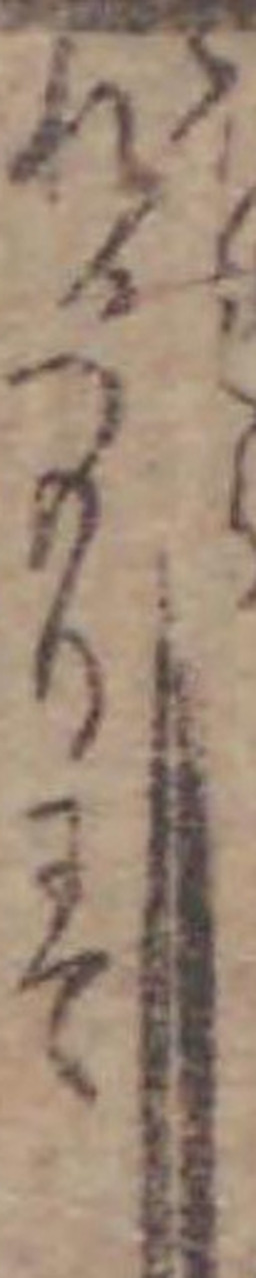れるつもりにて
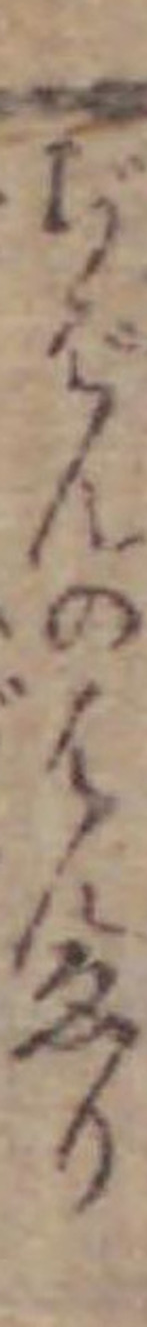ぢばんのはんゑり
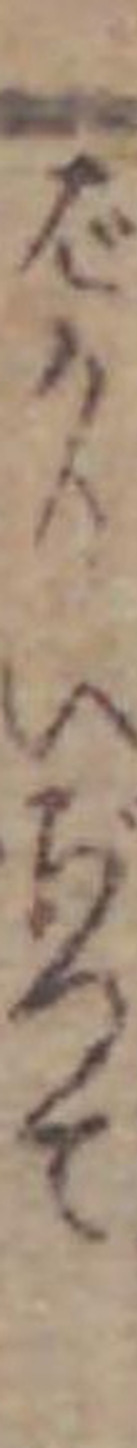ばかりいぢつて
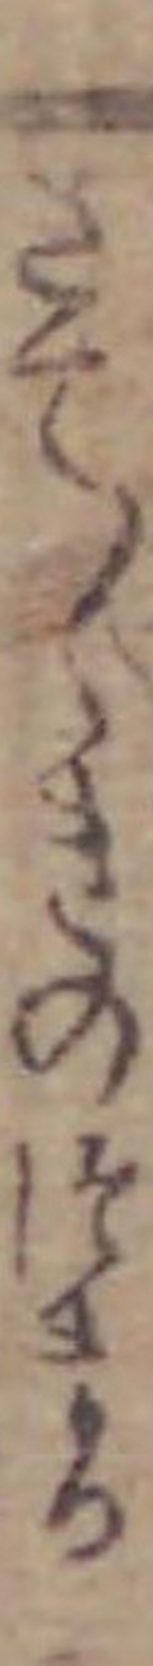さて〳〵きのつまる
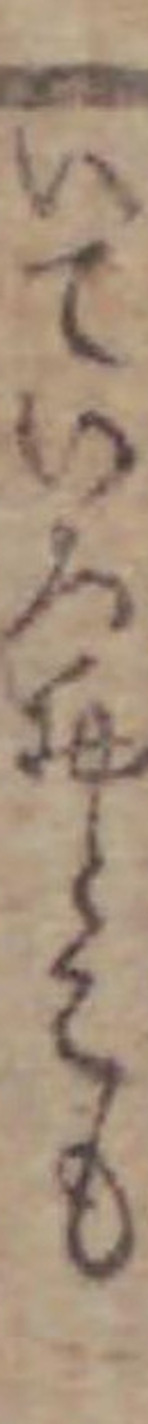いていろおとこも
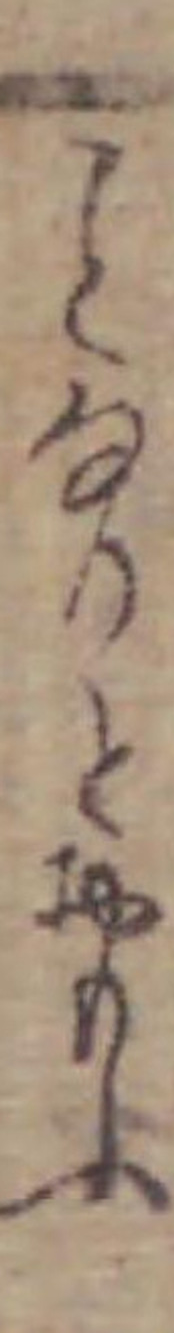ことなりとおもふ
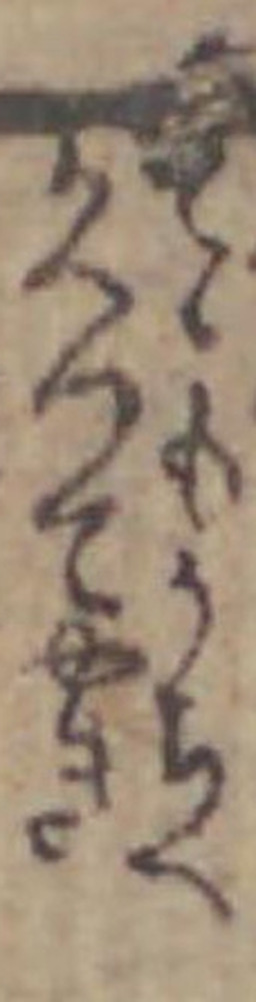かへってやき
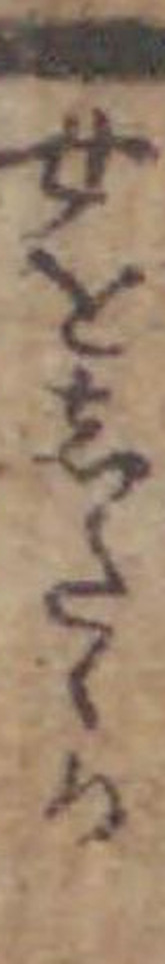女をしたゝか
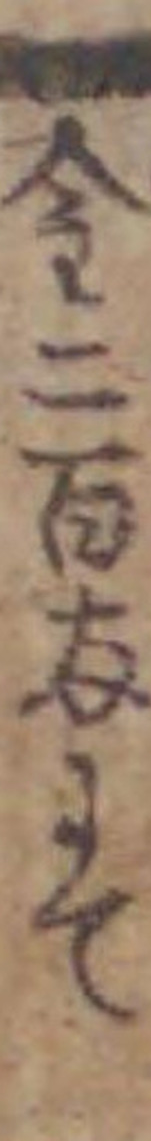金二百両にて
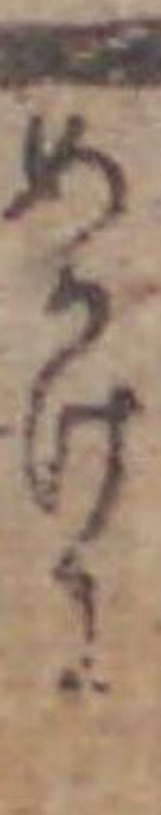めかけに
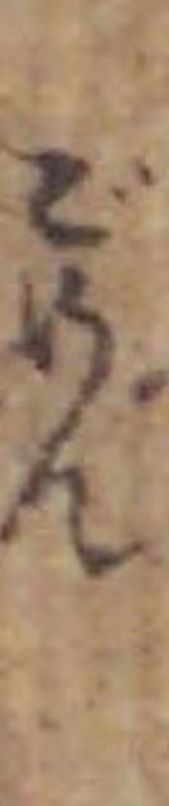ごめん
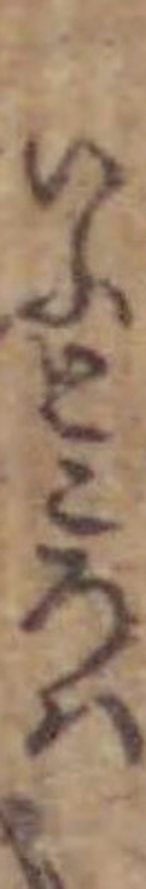いふところは
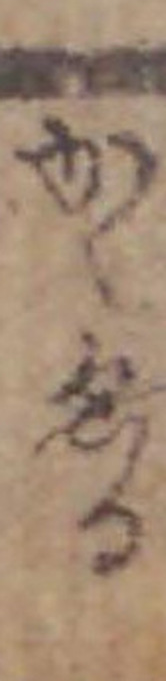かゝゑる
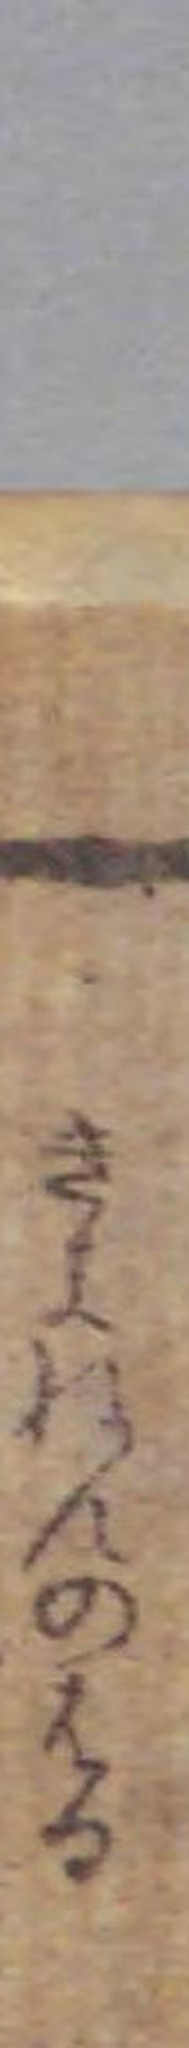きよねんのはる
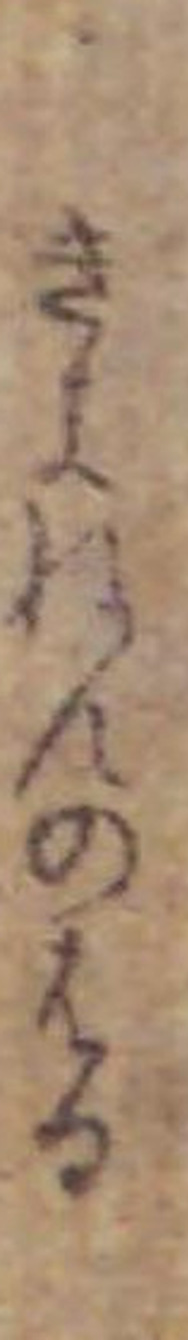きよねんのはる
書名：江戸生艶気樺焼 : 3巻
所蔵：国立国会図書館 National Diet Library, JAPAN
